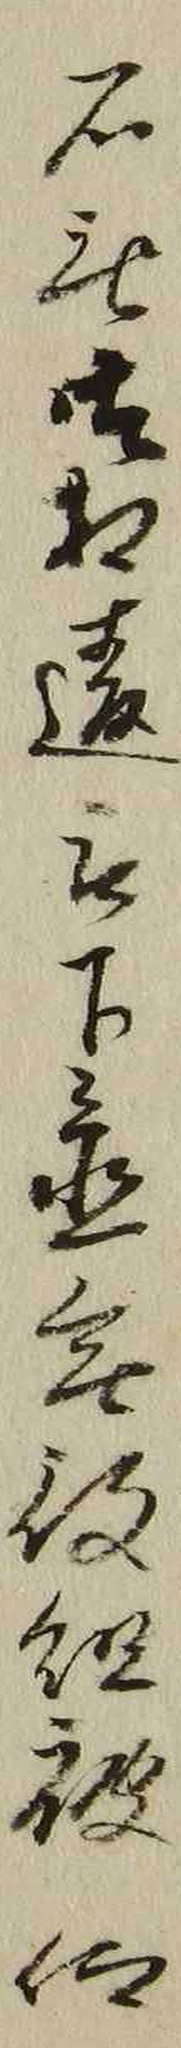石無御相違被下置無役組被仰
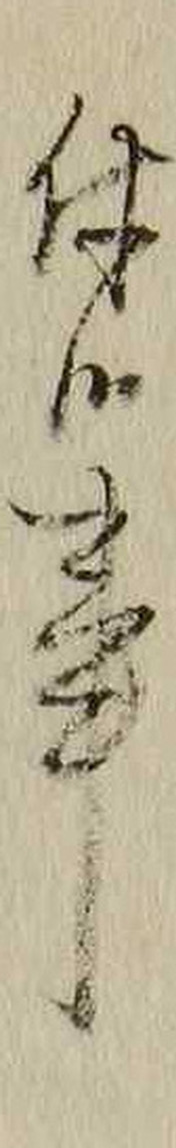付候事
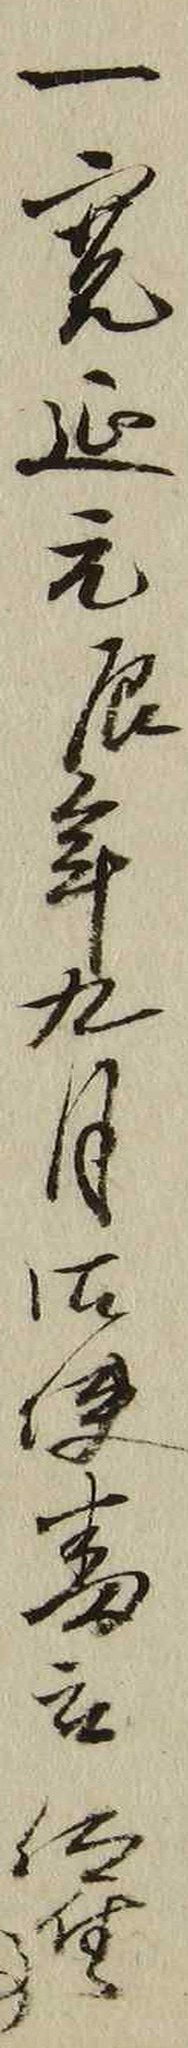一寛延元辰年九月御使番被仰付候事
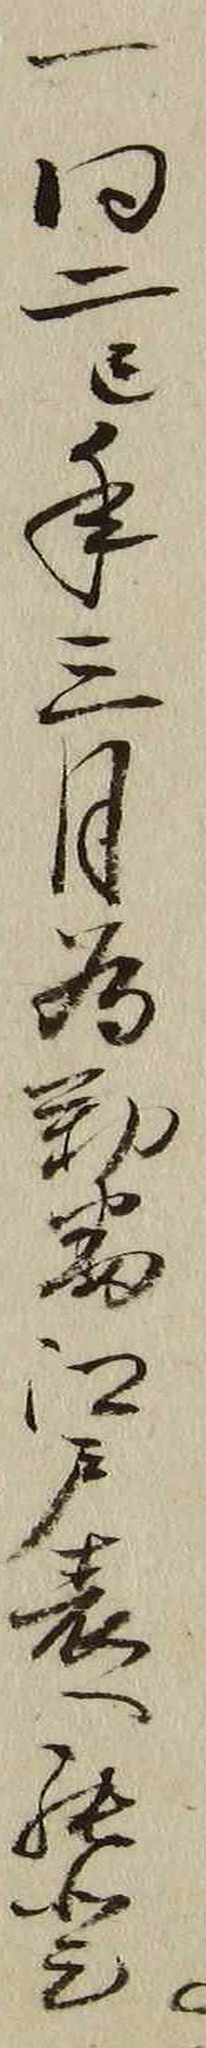一同二巳年三月為勤番江戸表へ罷登
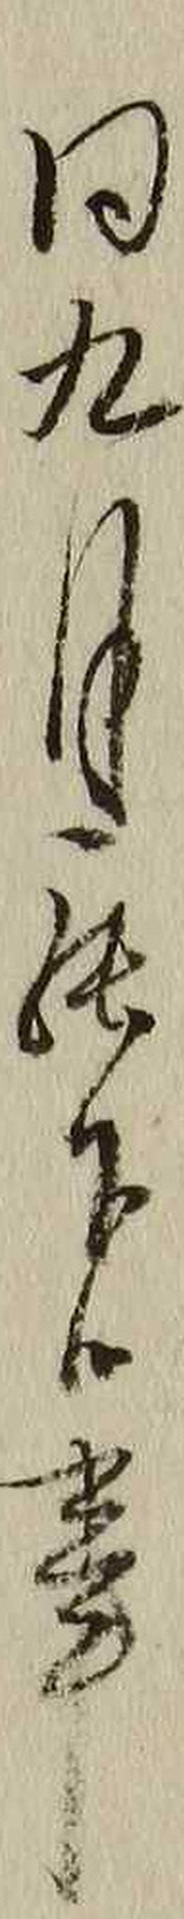同九月罷下候事
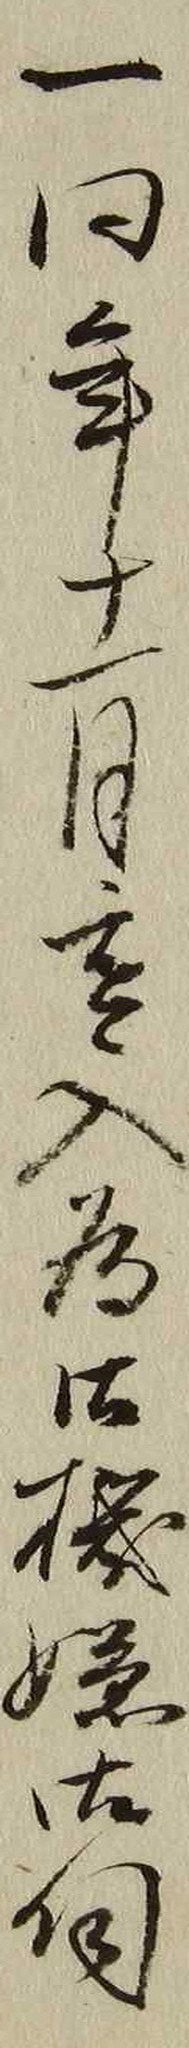一同年十一月寒入為御機嫌御伺
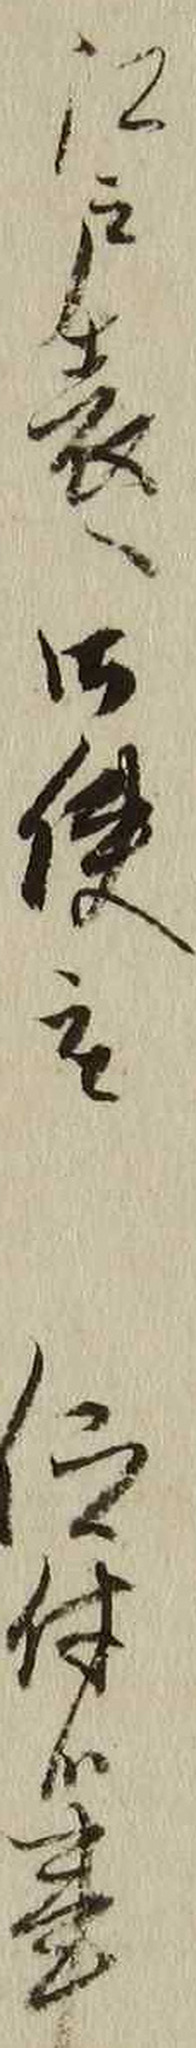江戸表へ御使被仰付候事
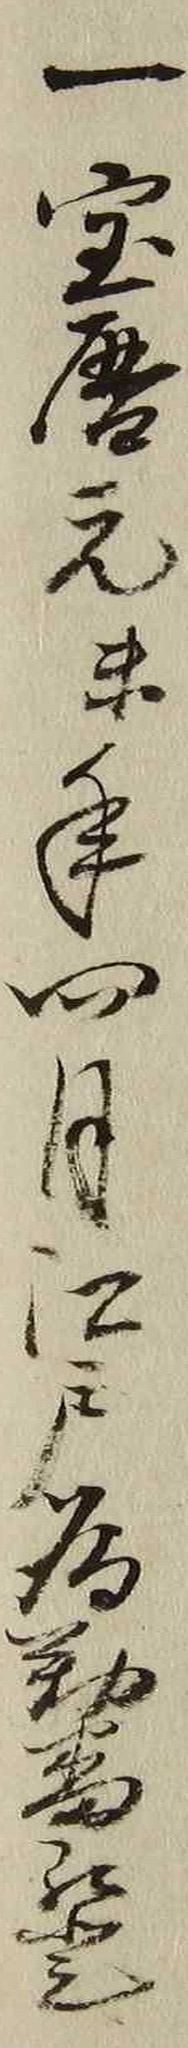一宝暦元未年四月江戸為勤番罷登
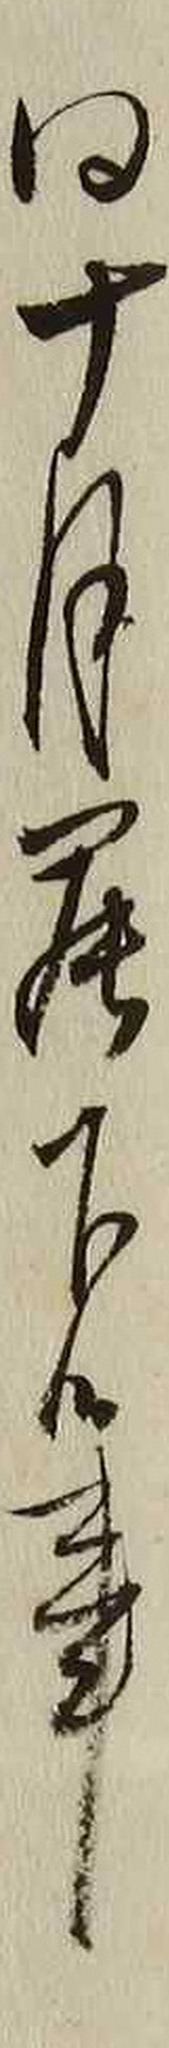同十月罷下候事
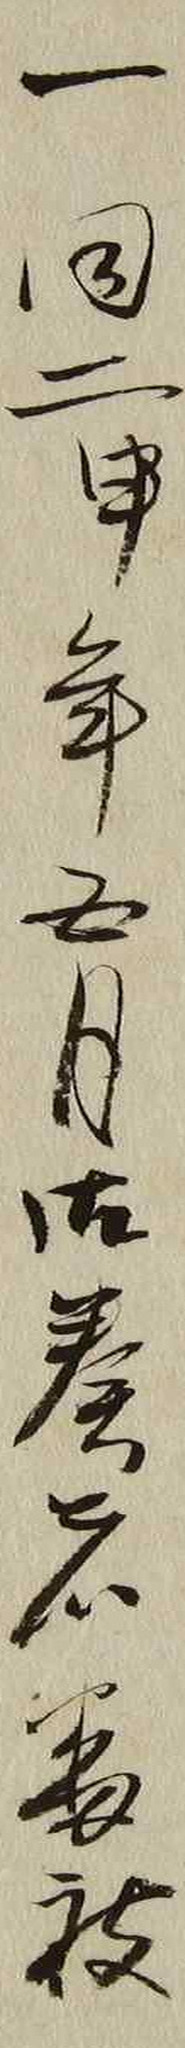一同二申年五月御奏者番被
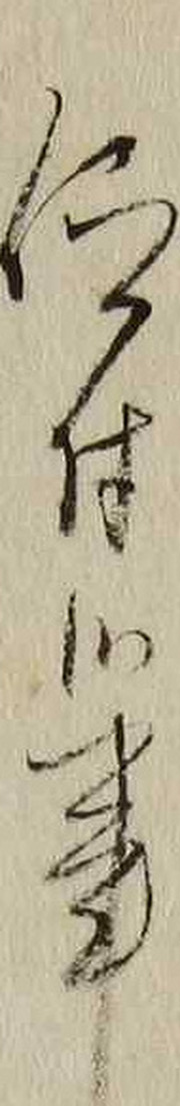仰付候事
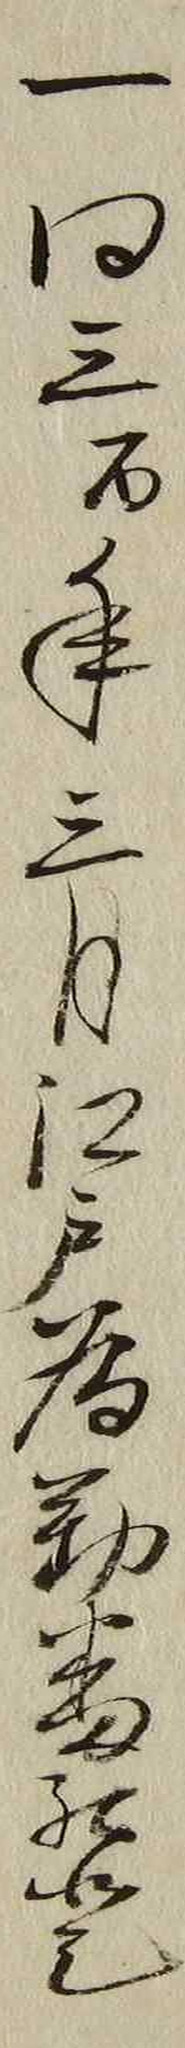一同三酉年三月江戸為勤番罷登
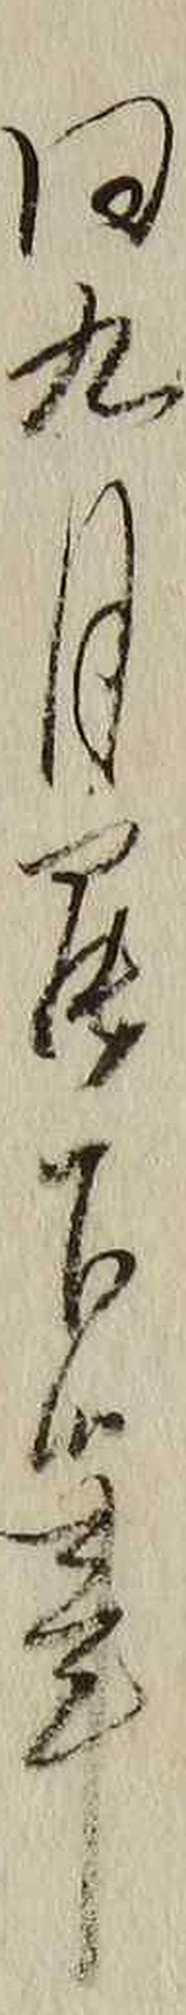同九月罷下候事
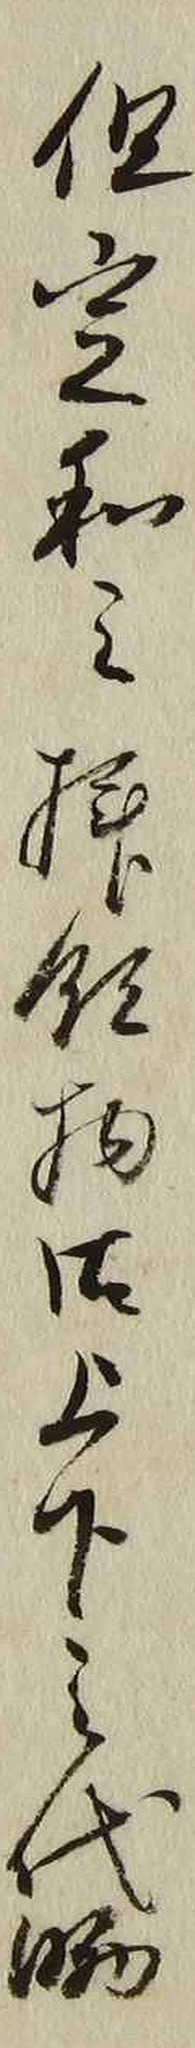但定和之拝領物御上下之代晒
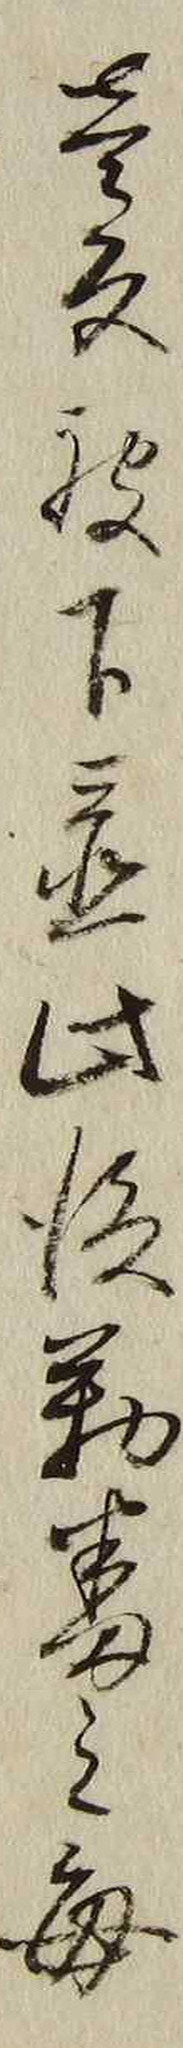壱反被下置此後勤番之毎
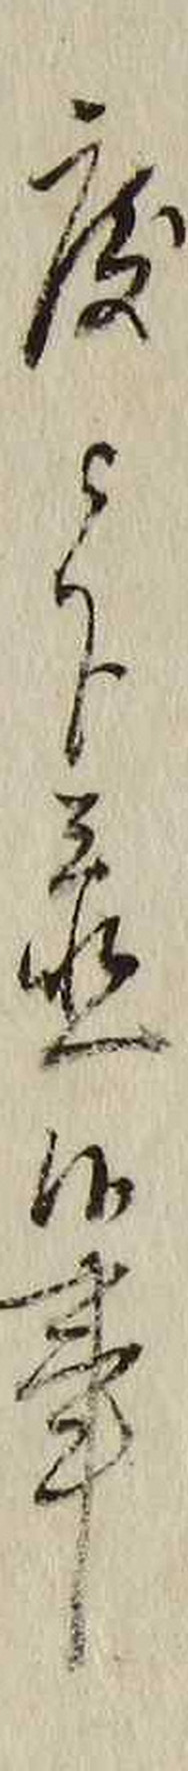度被下置候事
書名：諸士系譜　巻之351　す之部1
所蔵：会津若松市立会津図書館
